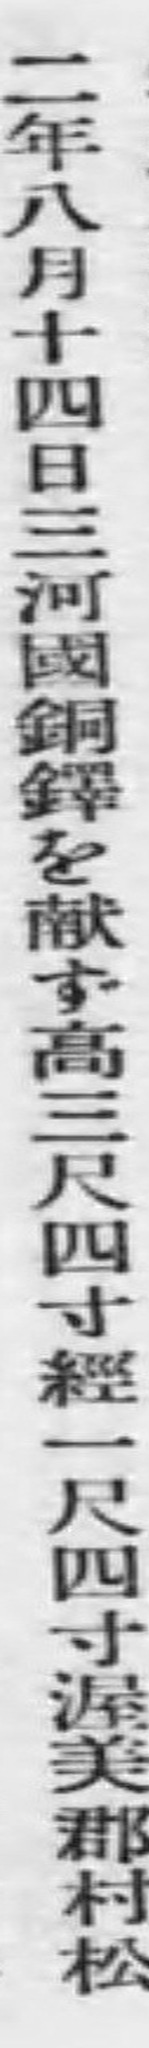二年八月十四日三河国銅鐸を献す高三尺四寸経一尺四寸渥美郡村松
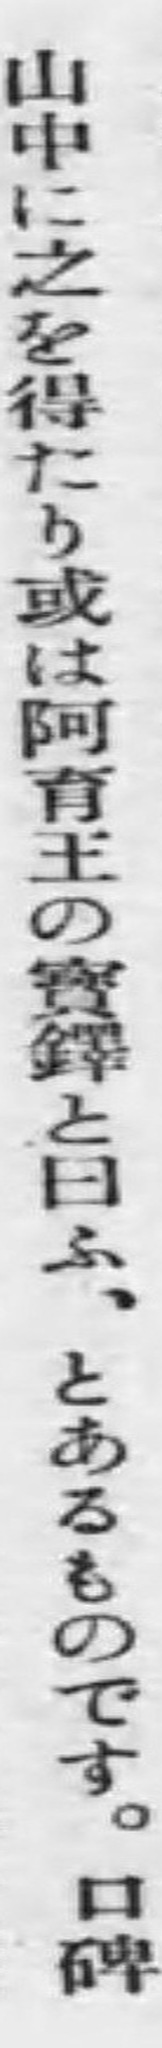山中に之を得たり或は阿育王の宝鐸と曰ふ、とあるものです。口碑
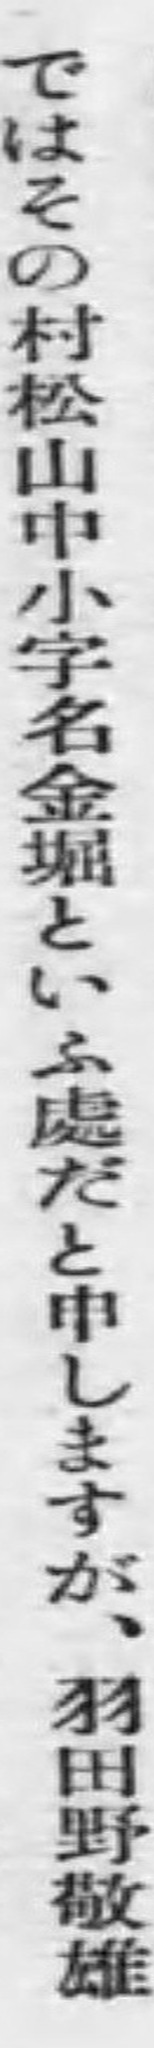ではその村松山中小字名金堀といふ処だと申しますが、羽田野敬雄
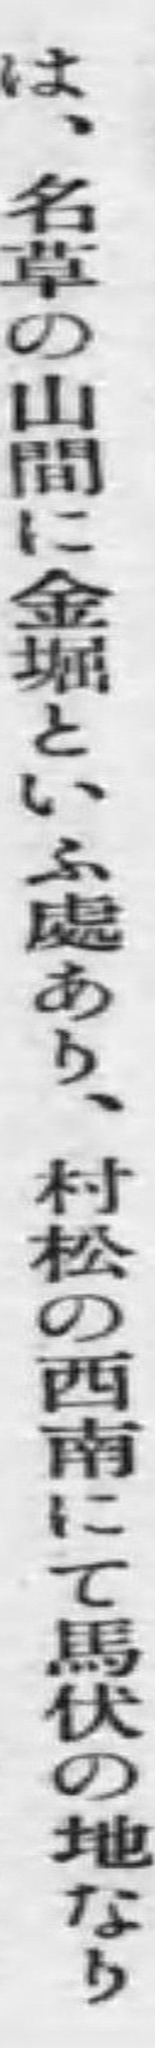は、名草の山間に金堀といふ処あり、村松の西南にて馬伏の地なり
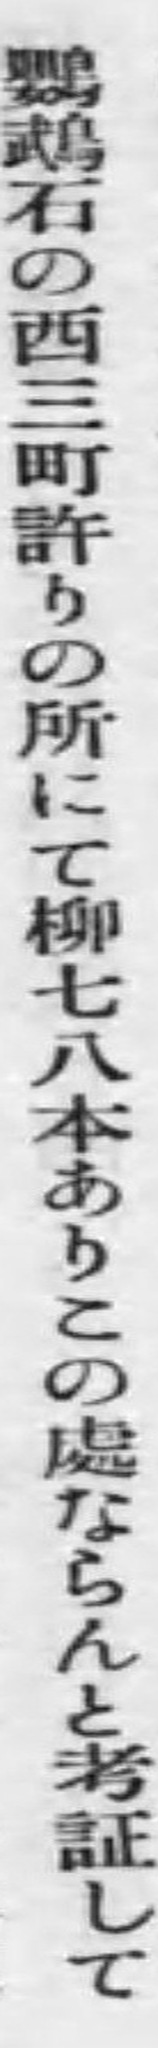鸚鵡石の西三町許りの所にて柳七八本ありこの処ならんと考証して
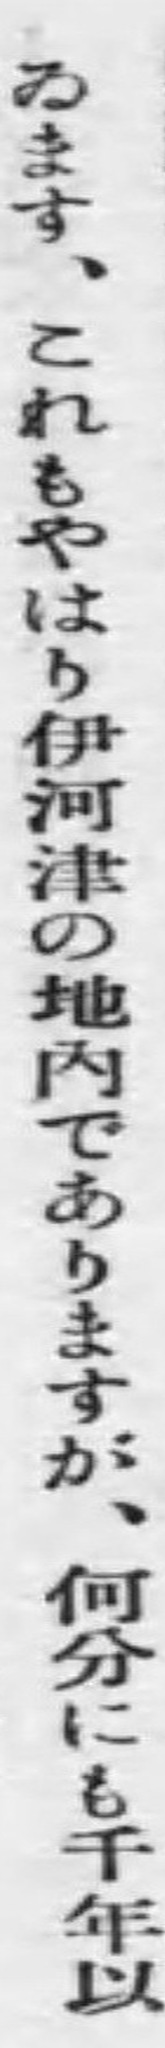ゐます、これもやはり伊河津の地内でありますが、何分にも千年以
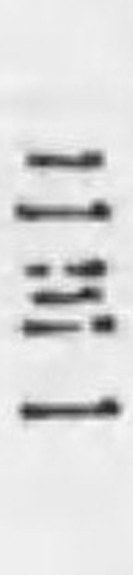二三一

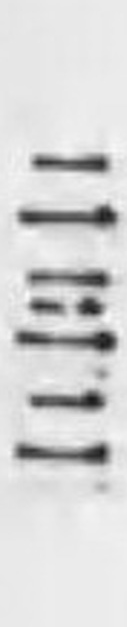二三二
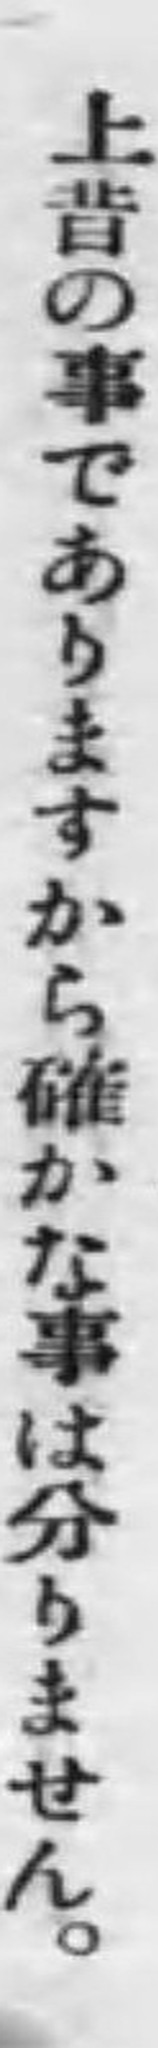上昔の事でありますから確かな事は分りません。
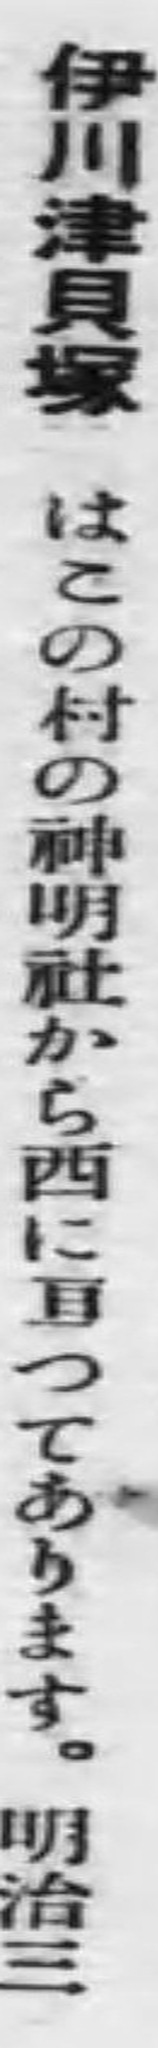伊川津貝塚はこの村の神明社から西に亘つてあります。明治三
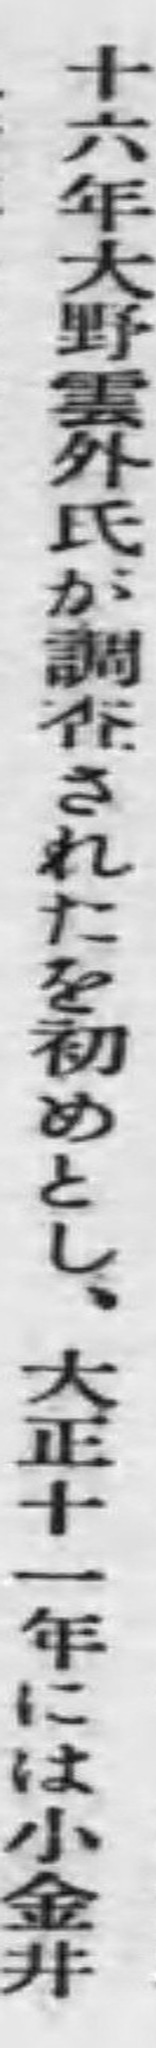十六年大野雲外氏が調査されたを初めとし、大正十一年には小金井
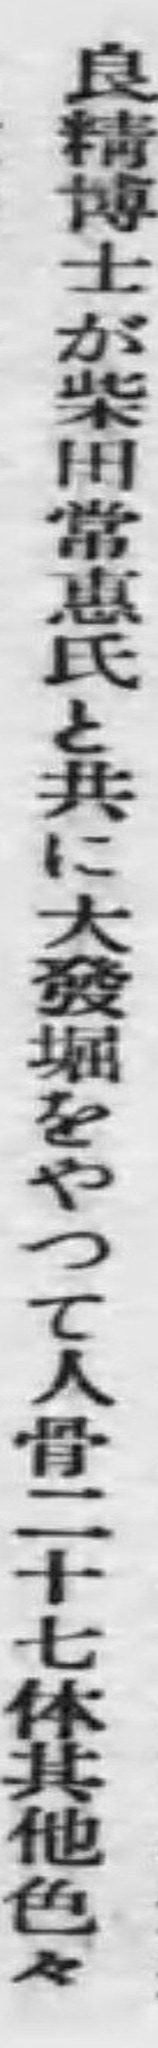良精博士が柴田常恵氏と共に大発堀をやつて人骨二十七体其他色々
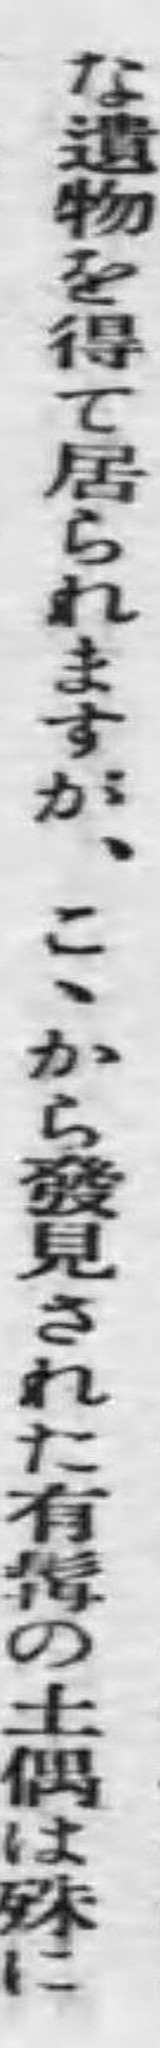な遺物を得て居られますが、こゝから発見された有髯の土偶は殊に
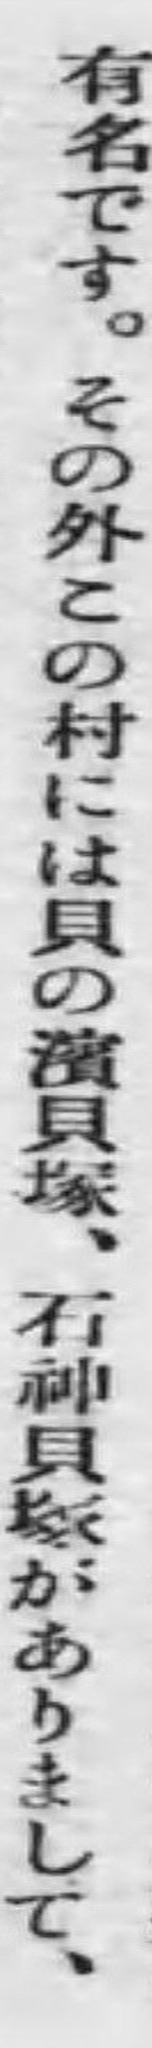有名です。その外この村には貝の浜貝塚、石神貝塚がありまして、
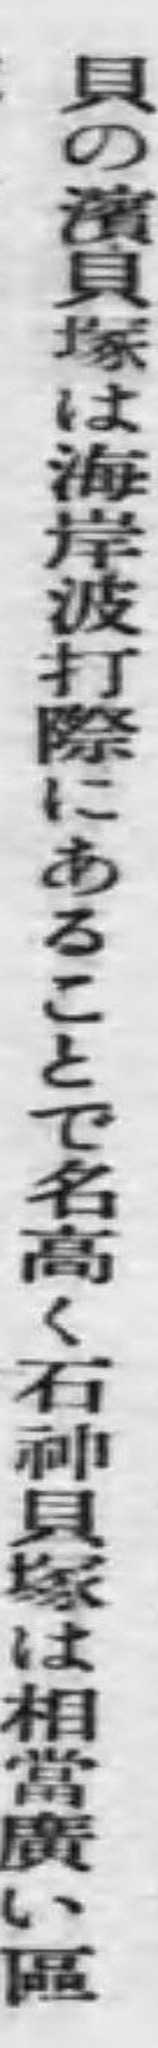貝の浜貝塚は海岸波打際にあることで名高く石神貝塚は相当広い区
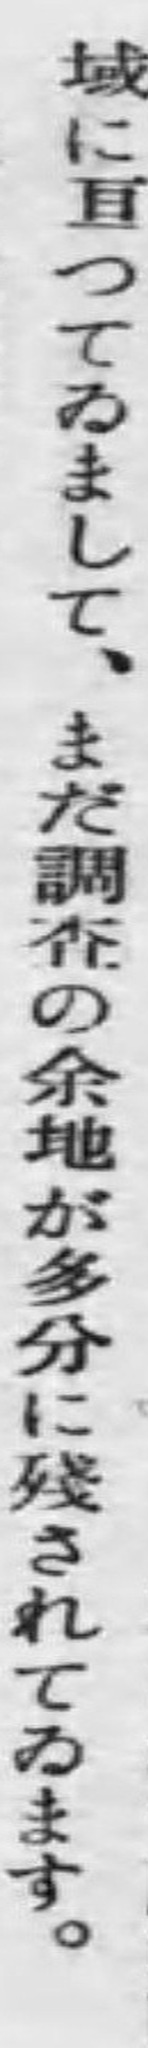域に亘つてゐまして、まだ調査の余地が多分に残されてゐます。
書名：東三河道中記 : 豊橋市及其附近案内
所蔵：国立国会図書館 National Diet Library, JAPAN
